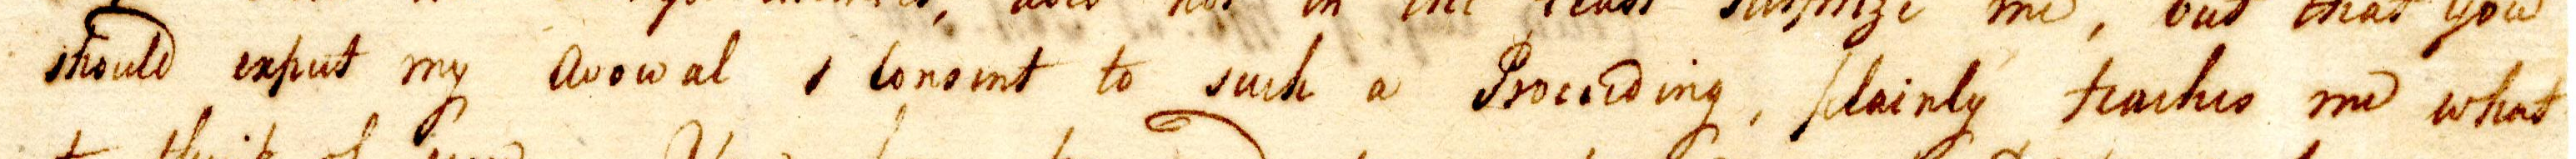should expect my avowal & Consent to such a Proceeding, plainly teaches me what
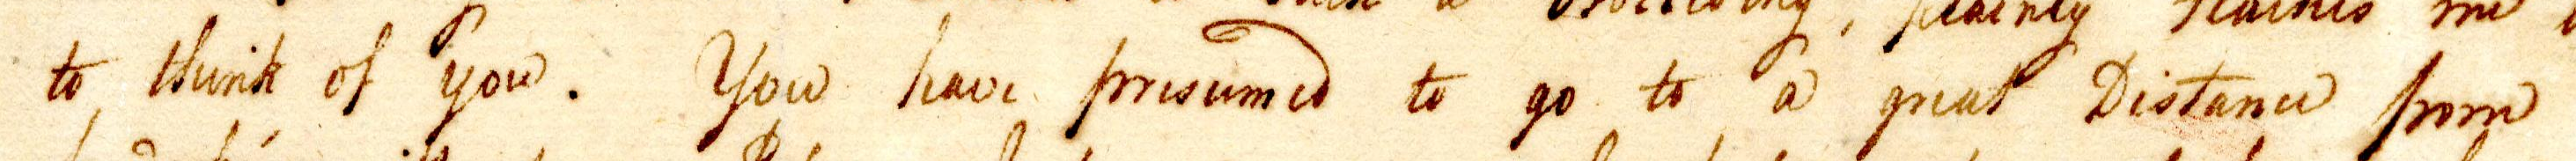to think of you. You have presumed to go to a great Distance from
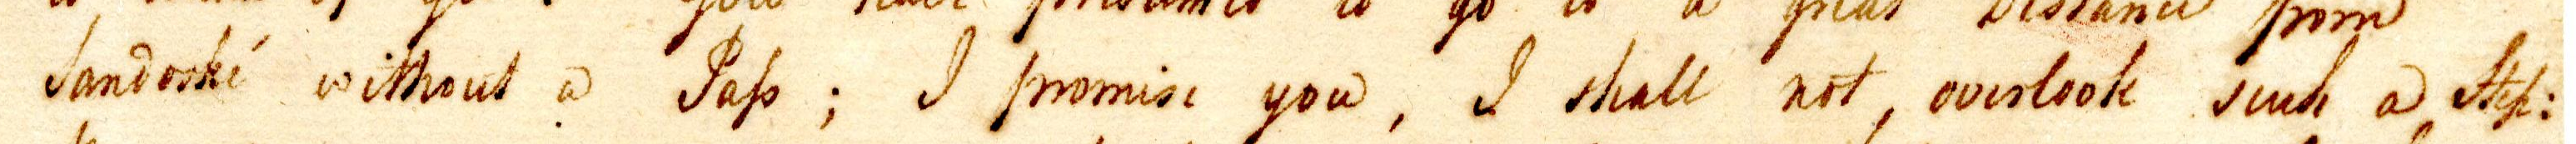Sanduské without a Pass; I promise you, I shall not overlook such a Step:
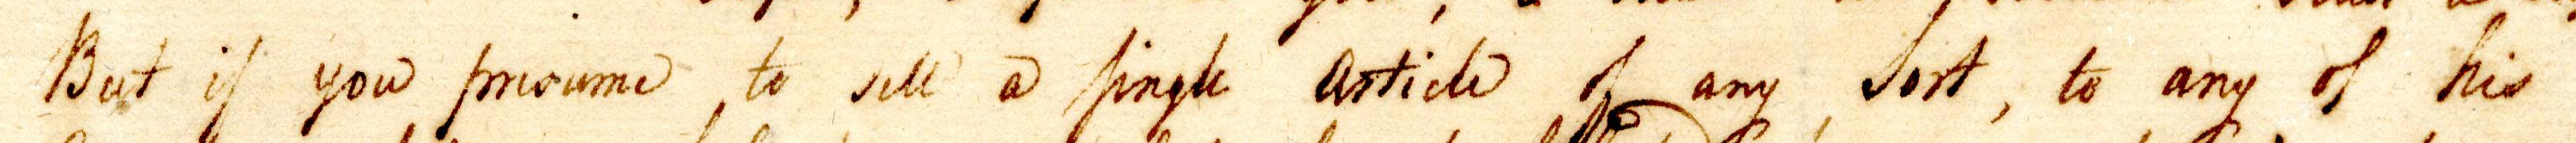But if you presume, to sell a single Article of any Sort, to any of his
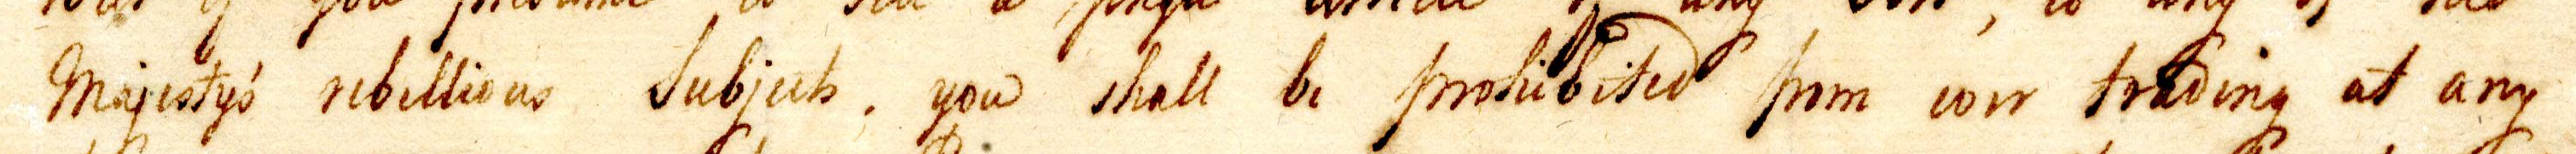Majesty's rebellious Subjects you shall be prohibited from war trading at any
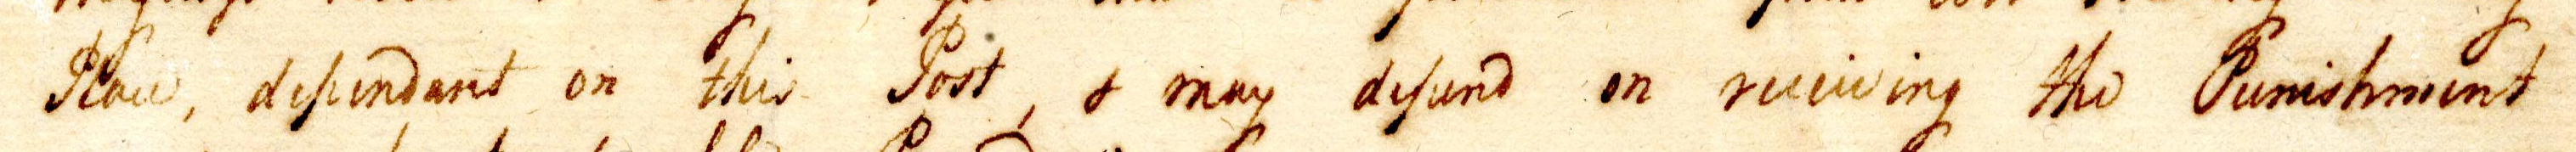Place, dependant on this Post, & may depend on receiving the Punishment
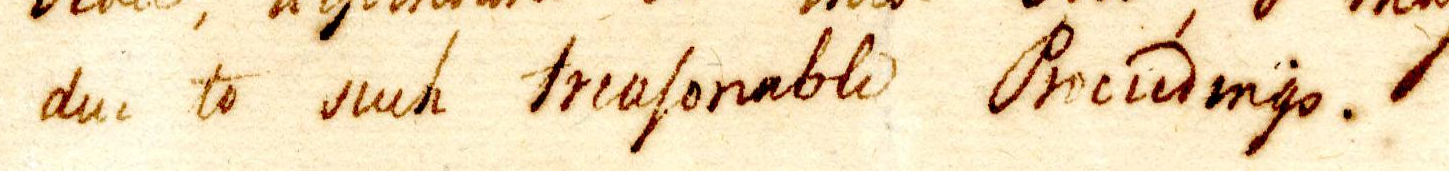due to such treasonable Procedings.
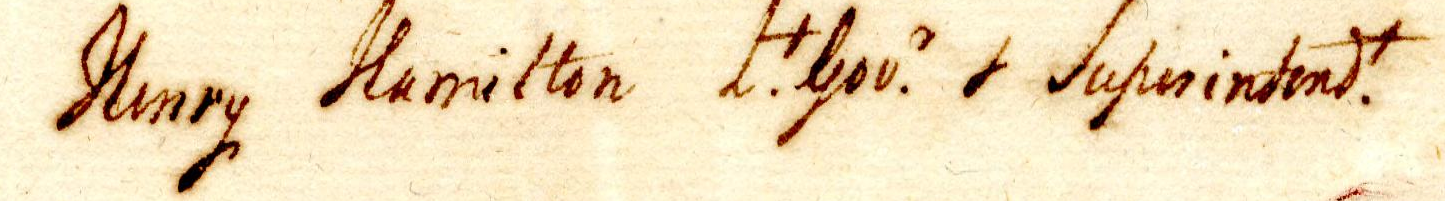Henry Hamilton L^t. Gov^r. & Suprintend^t.
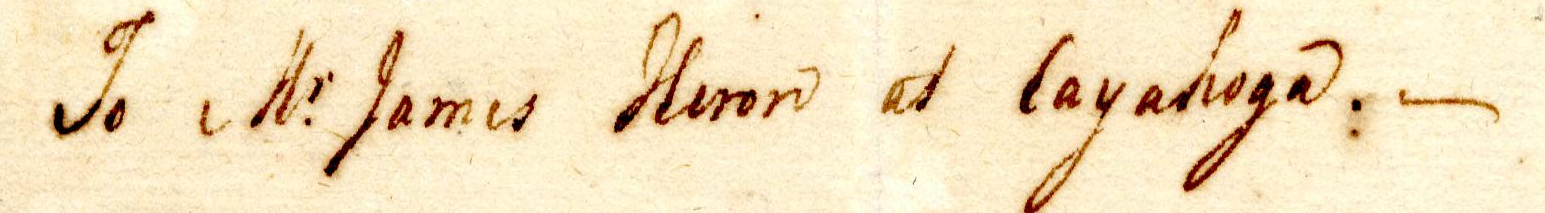To M^r. James Heron at Cayahoga:-
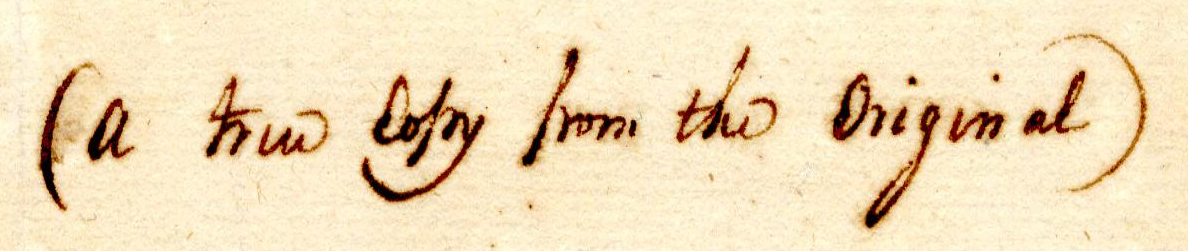(a true copy from the Original)
